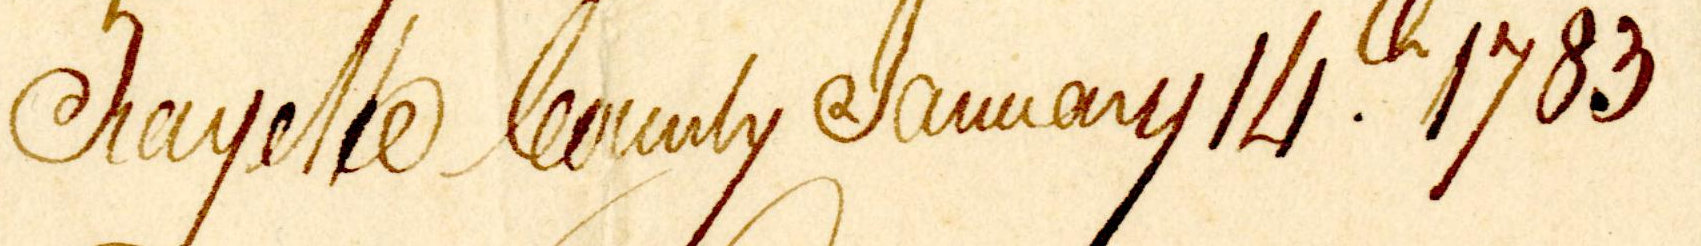Fayette County January 14^th. 1783
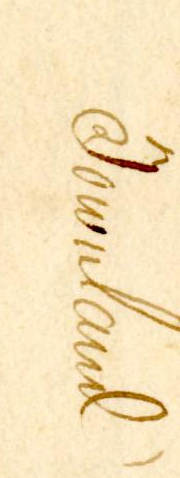Townland
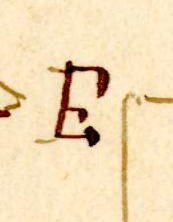E.
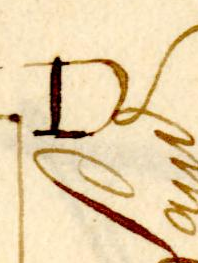D
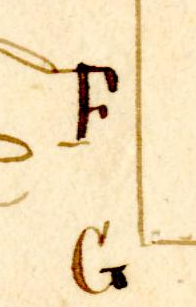F
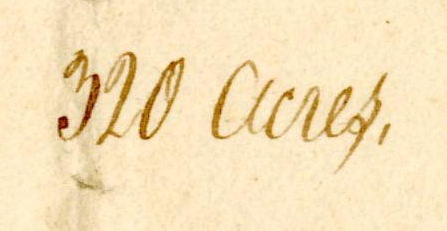320 Acres.
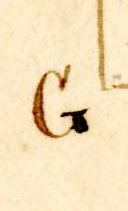G
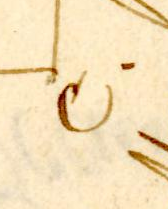C
